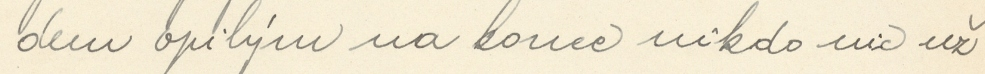dem opilým na konec nikdo nic už
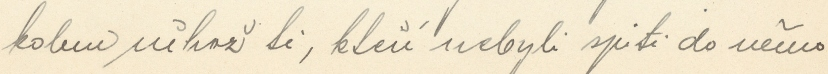kolem něhož ti, kteří nebyli spiti do němo-
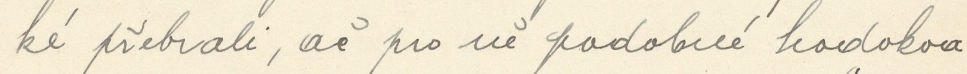ké přebrali, ač pro ně podobné hodokva-
